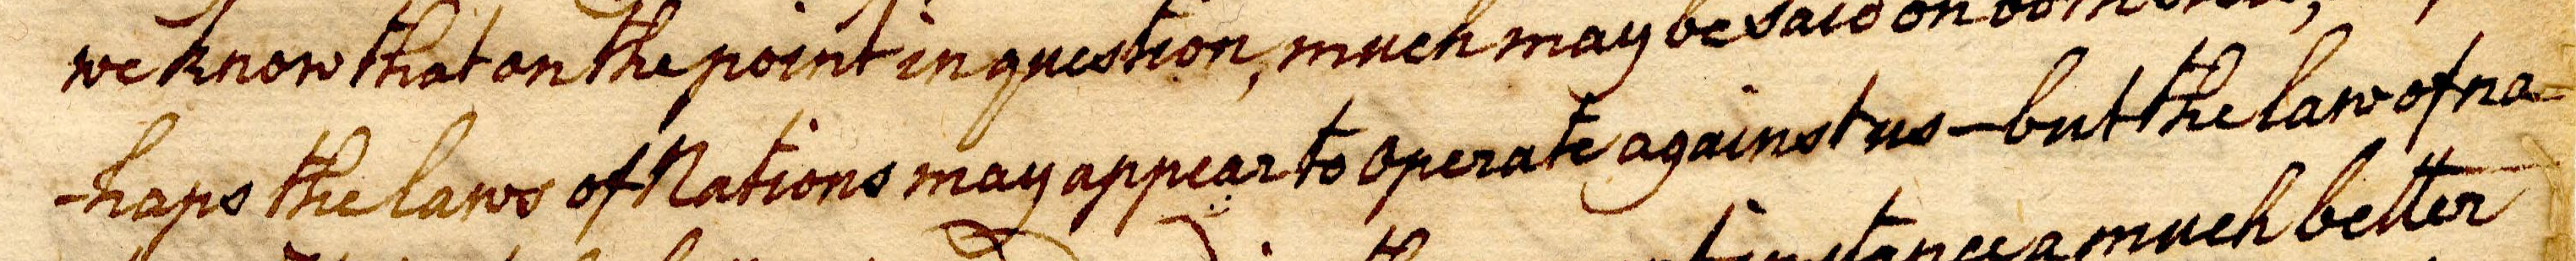-haps the laws of Nations may appear to operate against us- but the law of nat
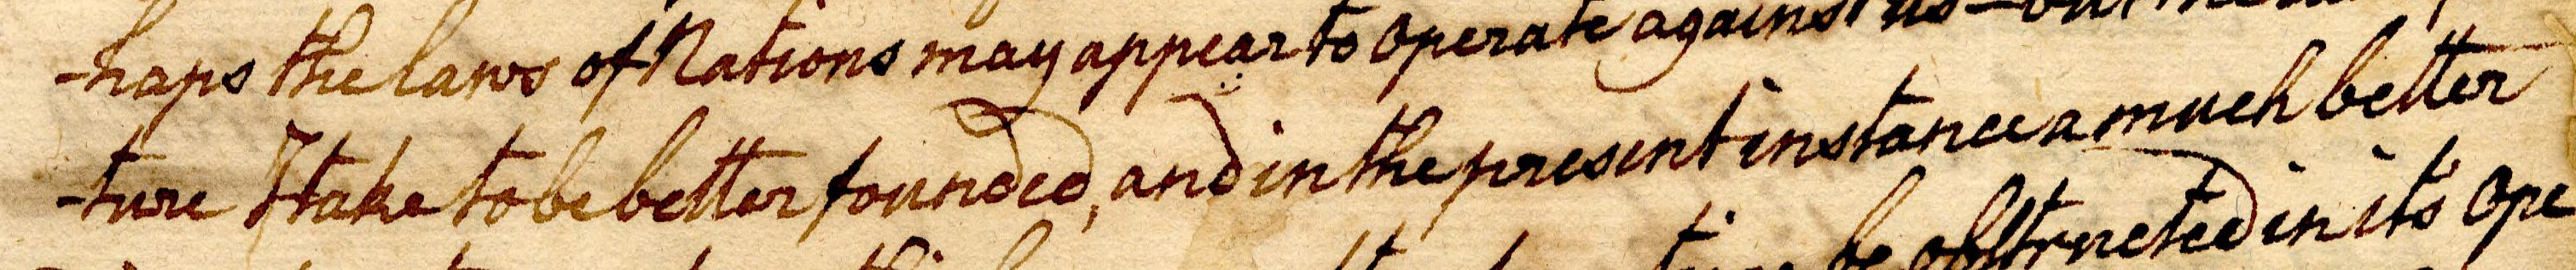-ture I take to be better founded, and in the present instance a much better
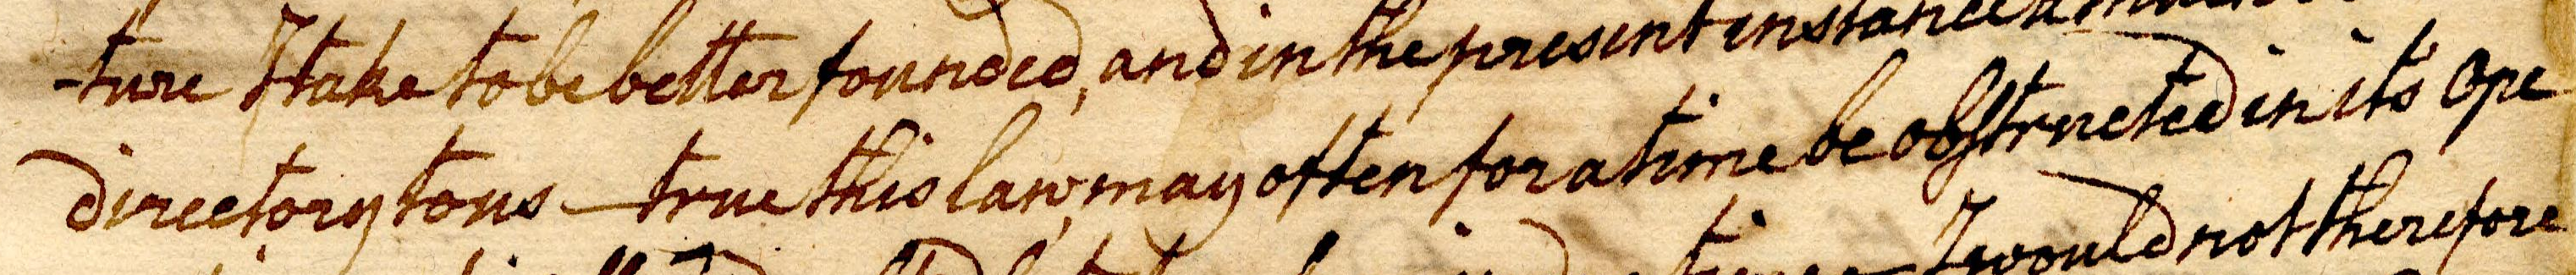directory to us- true this law may often for a time be obstructed in its Ope
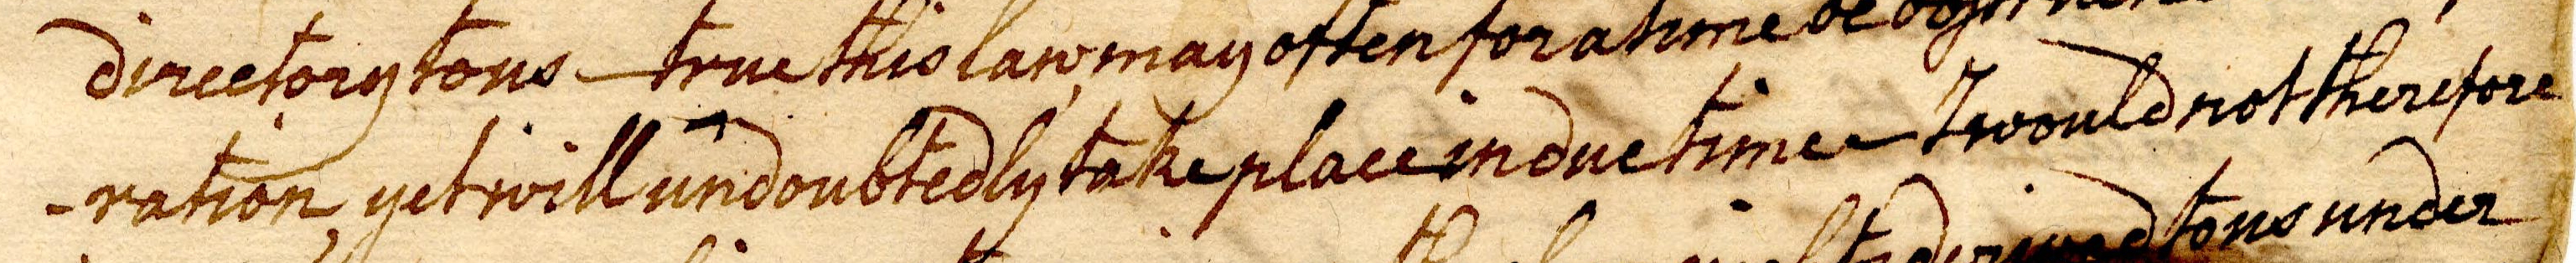-ration, yet will undoubtedly take place in due time I would not therefore
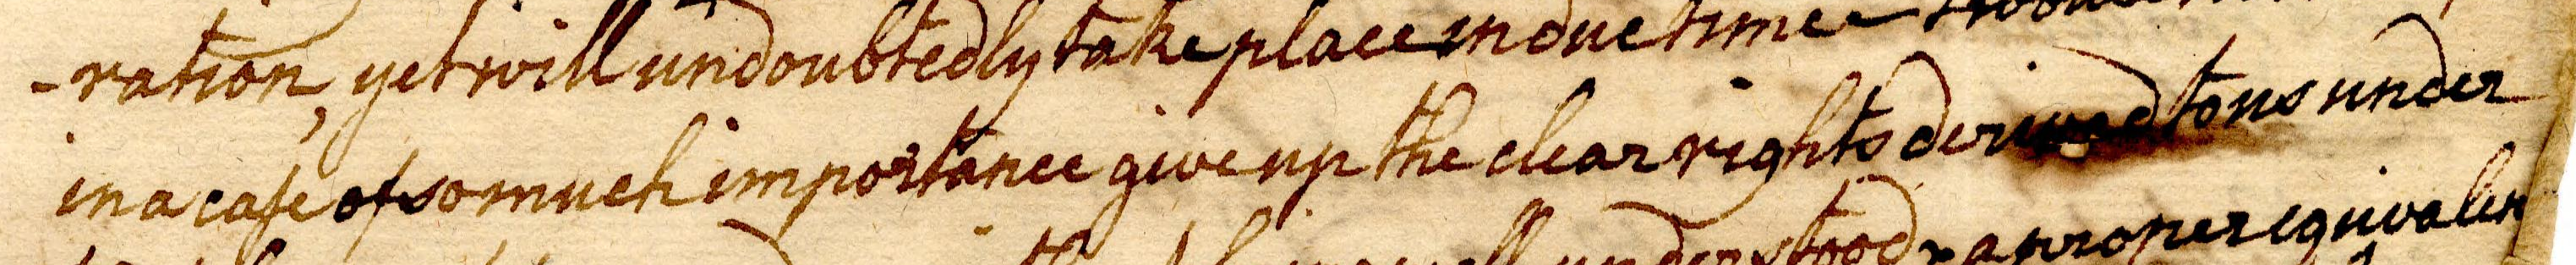in a case of so much importance give up the clear rights derived to us under
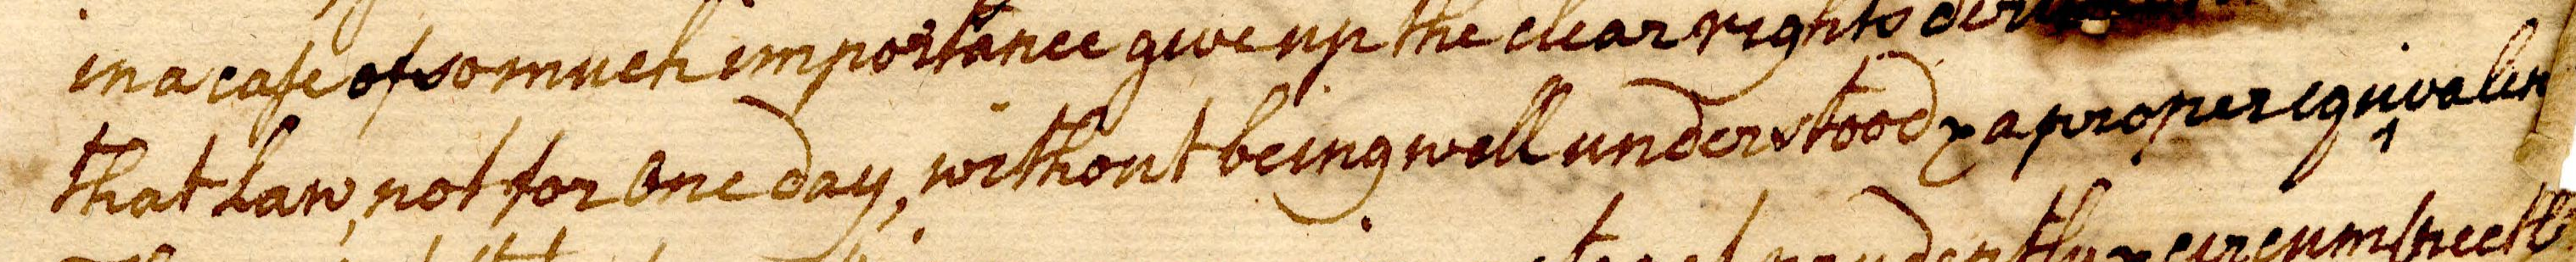that Law, not for one day, without being well understood & a proper equivalent
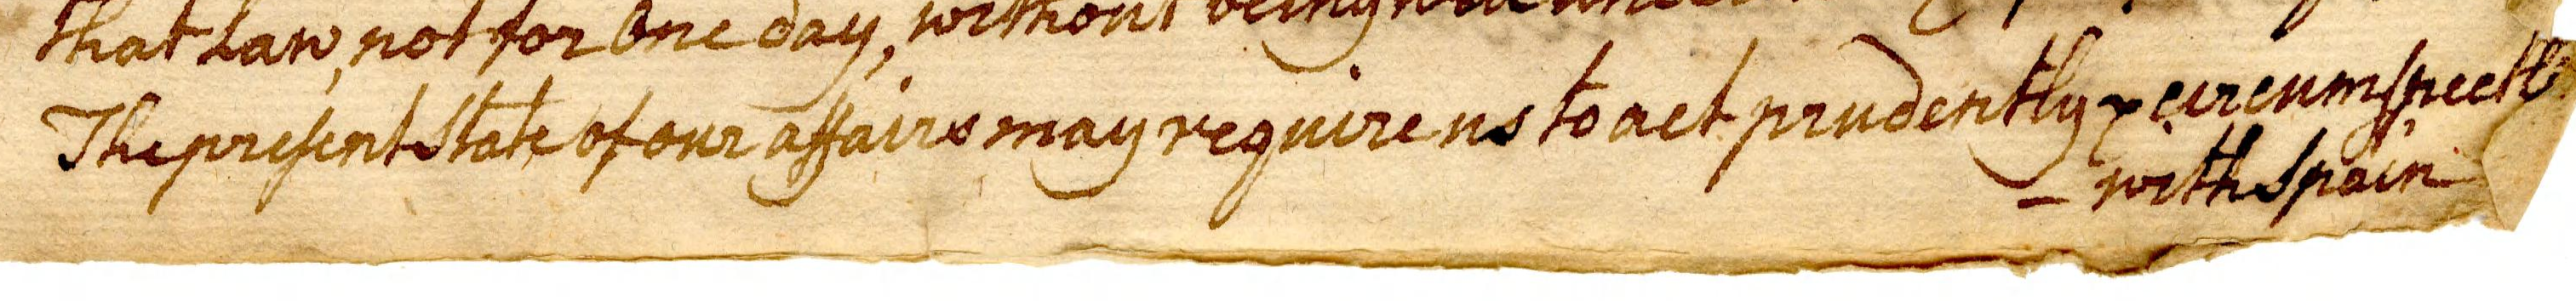The present state of our affairs may require us to act prudently & circumspectly
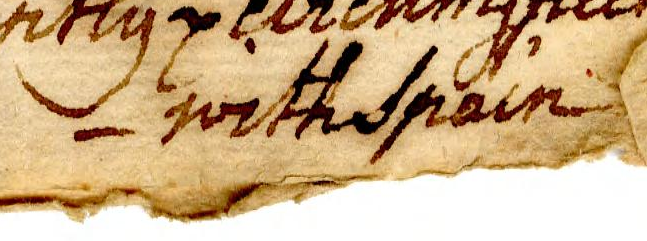-with spain
